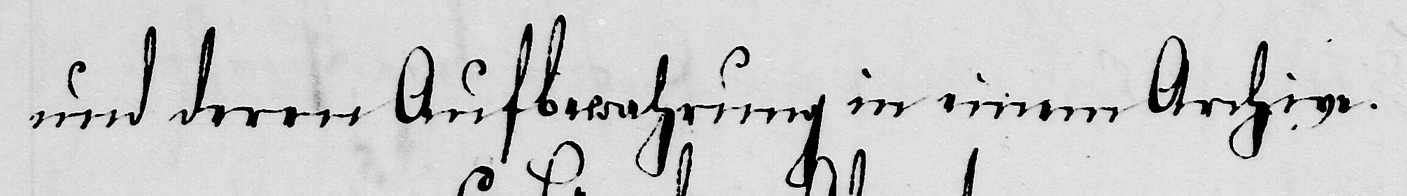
und deren Aufbewahrung in einem Archive.
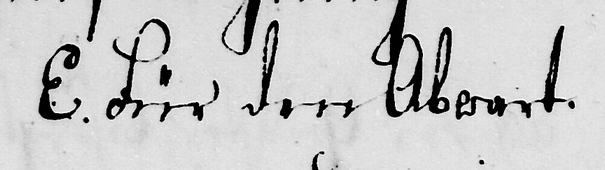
E. Für den Abwart.
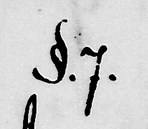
§.7.
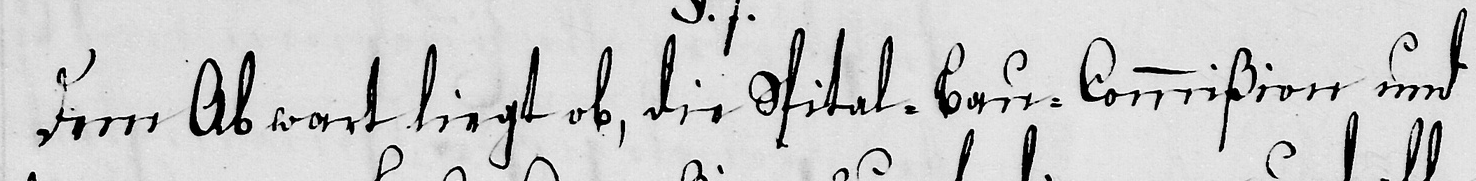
Dem Abwart liegt ob, die Spital-Bau-Commißion und
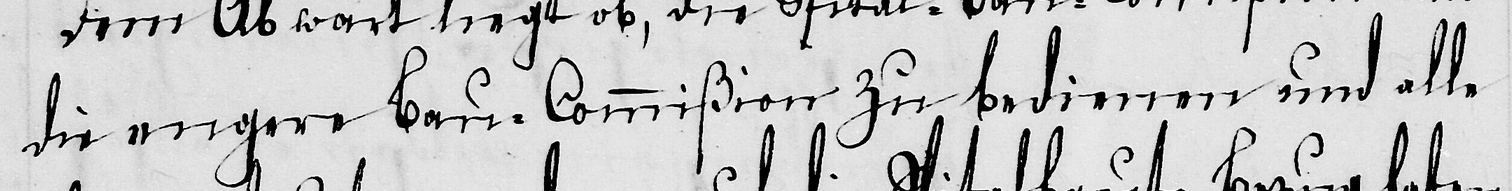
die engere Bau-Commißion zu bedienen und alle
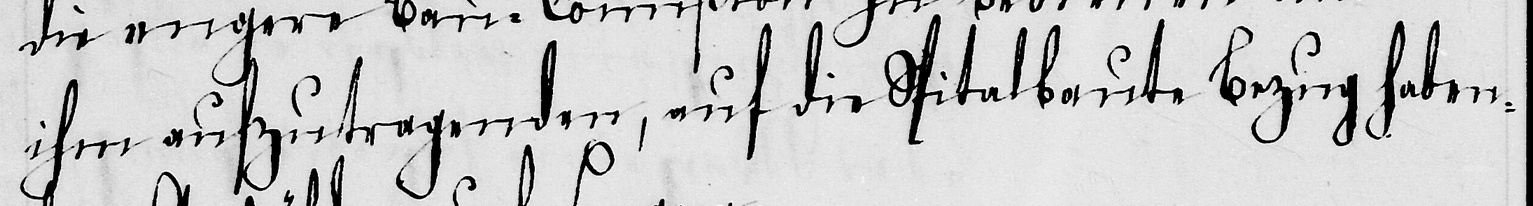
ihm aufzutragenden, auf die Spitalbaute Bezug haben¬
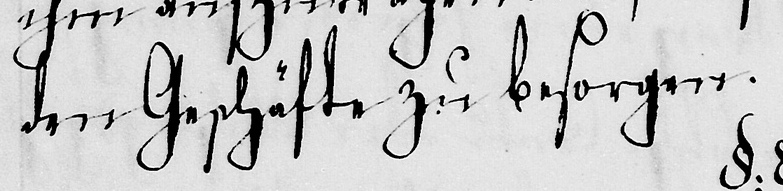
den Geschäfte zu besorgen.
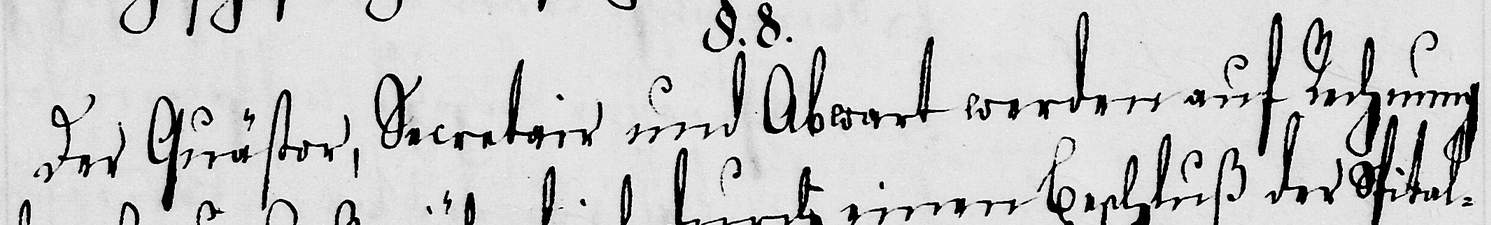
Der Quästor, Secretair und Abwart werden auf Rechnung
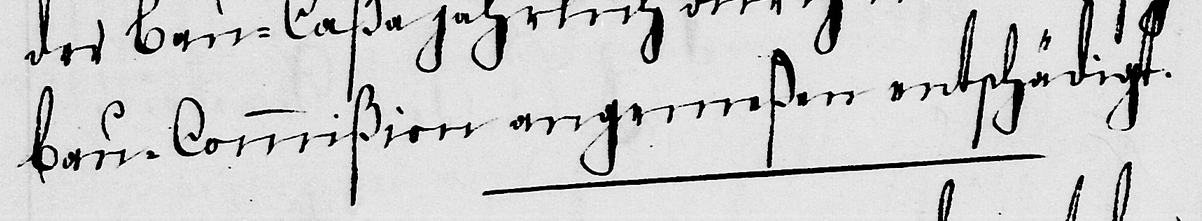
au-Commißion angemeßen entschädigt.
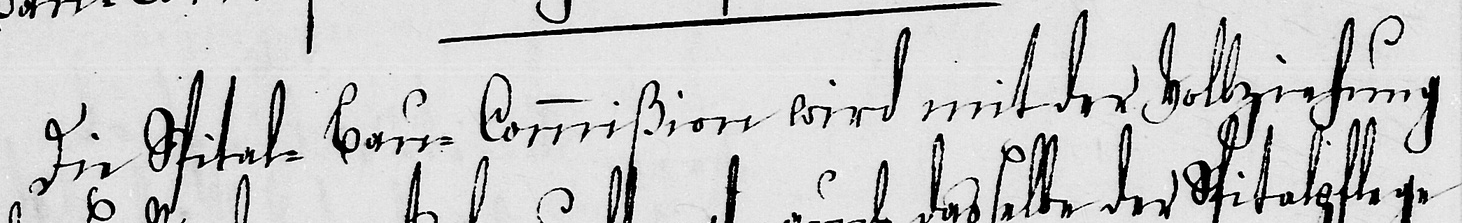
Die Spital-Bau-Commißion wird mit der Vollziehung
